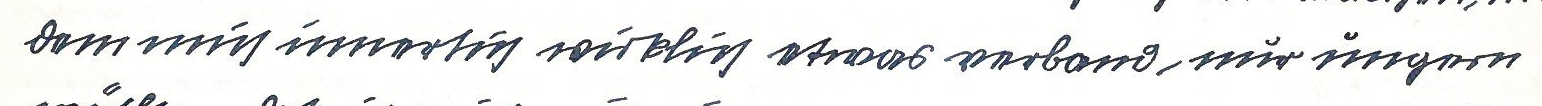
dem mich innerlich wirklich etwas verband, nur ungern
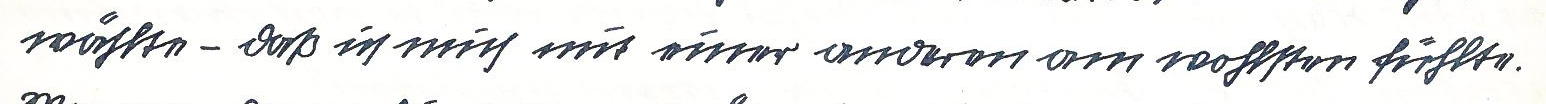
wählte – daß ich mich mit einer anderen am wohlsten fühlte.
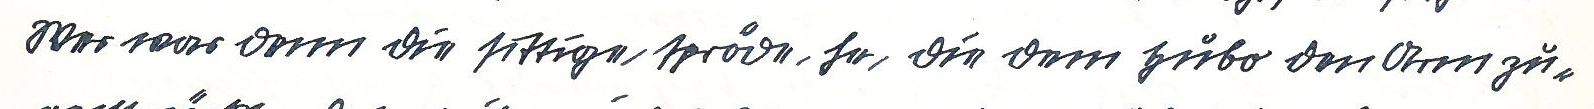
Wer war denn die sittige, spröde, he, die dem Hubo den Arm zu¬
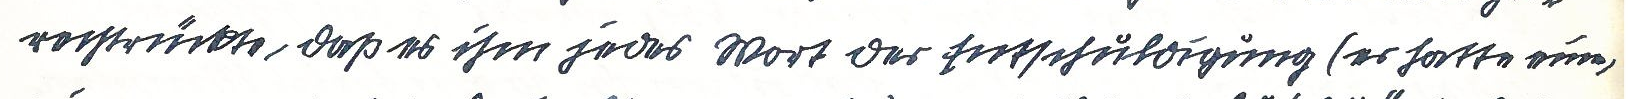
rechtdrückte, daß es ihm jedes Wort der Entschuldigung (er hatte eine,
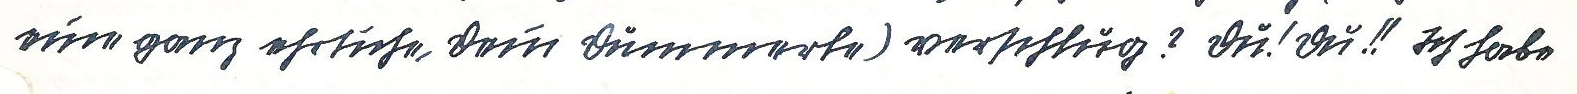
eine ganz ehrliche, Dein Dummerle) verschlug? Du! Du!! Ich habe
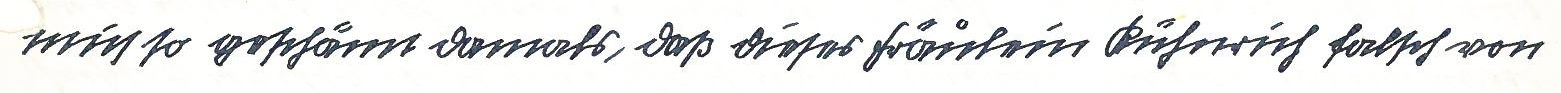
mich so geschämt damals, daß dieses Fräulein falsch von
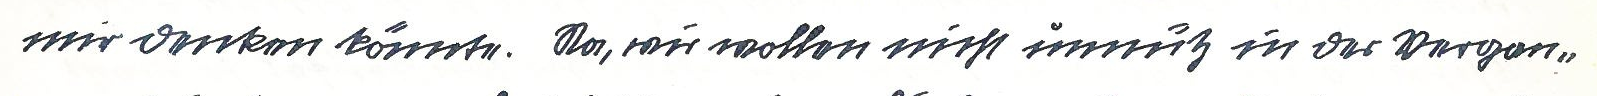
mir denken könnte. Na, wir wollen nicht unnütz in der Vergan¬
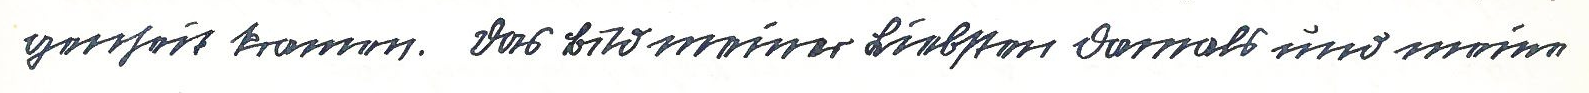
genheit kramen. Das Bild meiner Liebsten damals und meine
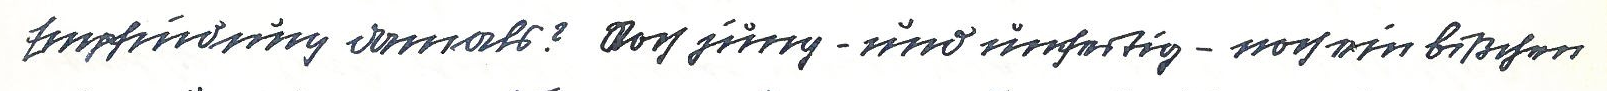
Empfindung damals? Noch jung – und unfertig – noch ein bißchen
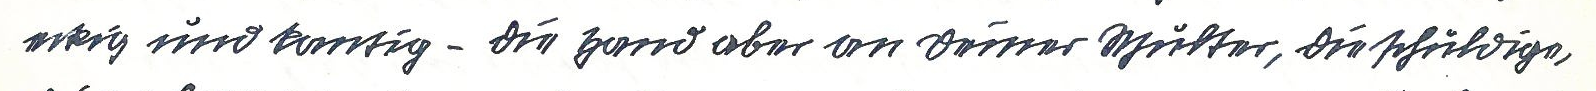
eckig und kantig – die Hand aber an Deiner Schulter, die Schuldige,
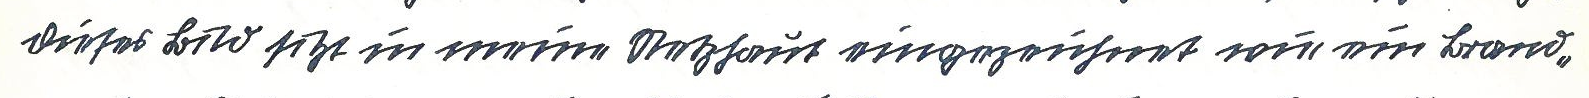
dieses Bild sitzt in meine Netzhaut eingezeichnet wie ein Brand¬
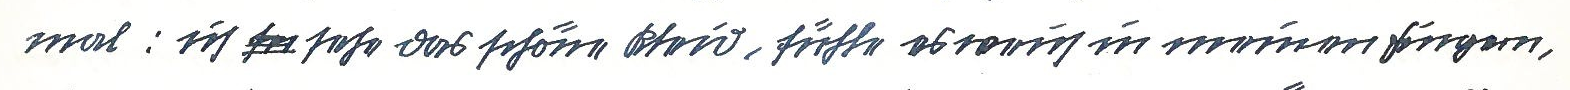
mal: ich se sehe das schöne Kleid, fühle es weich in meinen Fingern,
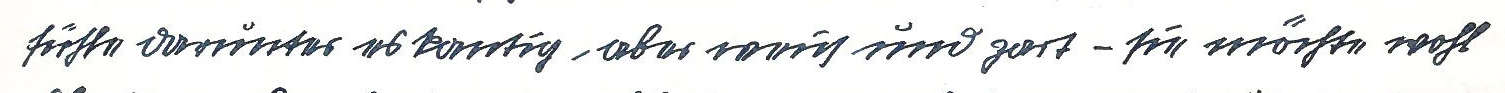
fühle darunter es kantig, aber weich und zart – sie möchte wohl
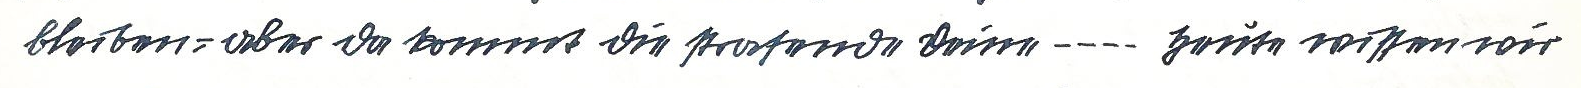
bleiben, – aber da kommt die strafende Deine – – – – Heute wissen wir
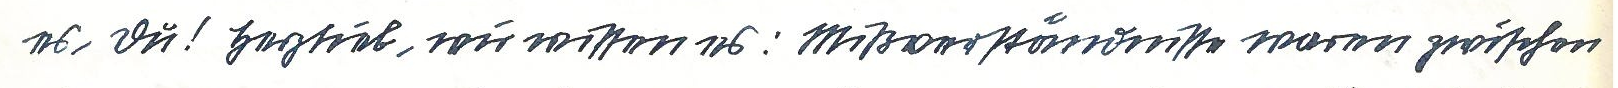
es, Du! Herzlieb, wir wissen es: Mißverständnisse waren zwischen
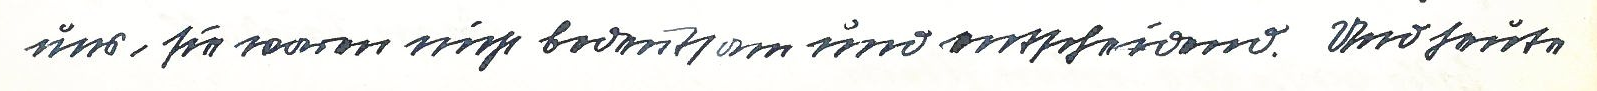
uns, sie waren nicht bedeutsam und entscheidend. Und heute
